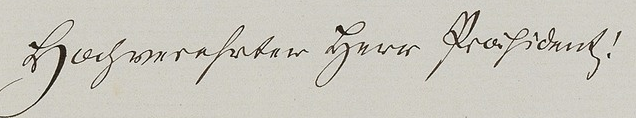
Hochverehrter Herr Präsident!
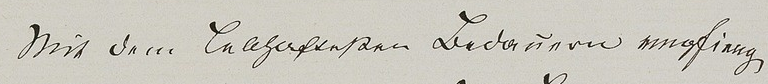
Mit dem lebhaftesten Bedauern empfieng
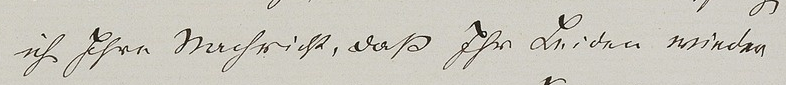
ich ihre Nachricht, daß Ihr Leiden wieder
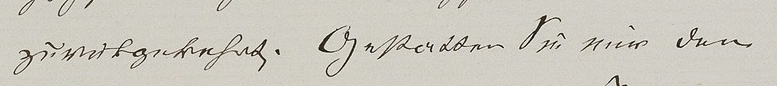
zurükgekehrt. Gestatten Sie mir den
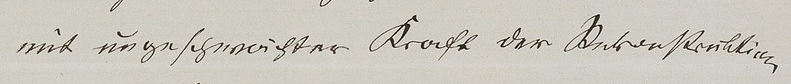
mit ungeschwächter Kraft der Rekonstruktion
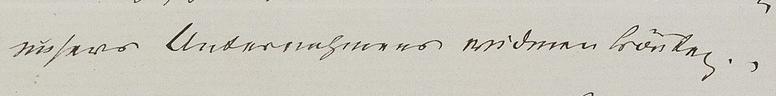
unsers Unternehmens widmen könnten. –
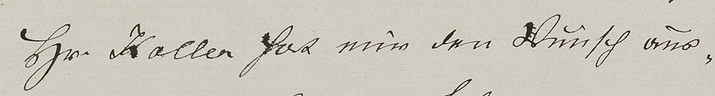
Hr. Koller hat mir den Wunsch aus-
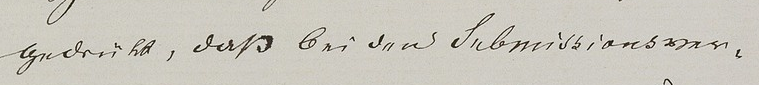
gedrükt, daß bei den Submissionsver-
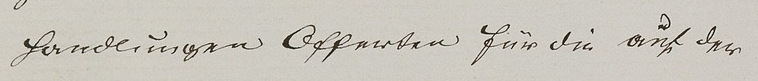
handlungen Offerten für die auf der
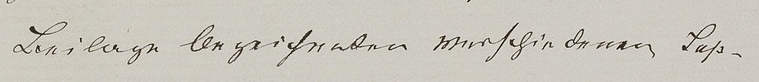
Beilage bezeichneten verschiedenen Sup-
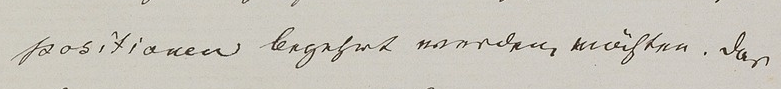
positionen begehrt werden möchten. Das
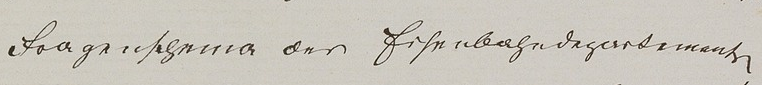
Fragenschema des Eisenbahndepartements,
